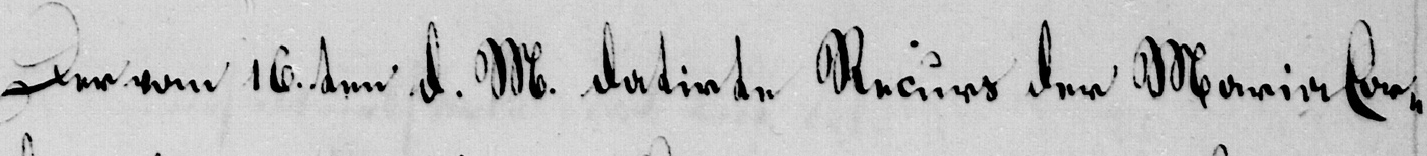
Der vom 16.ten d. M. datirte Recurs der Maria Cor¬
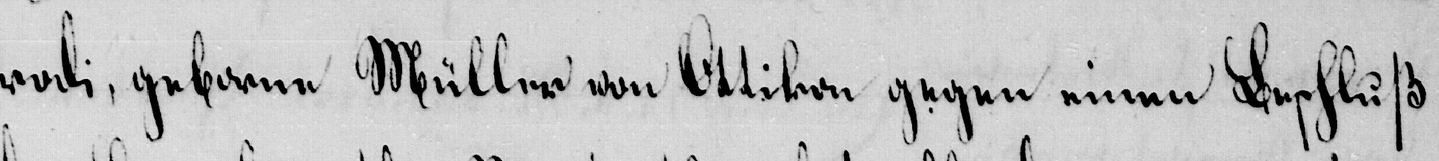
rodi, geborne Müller von Ottikon gegen einen Beschluß
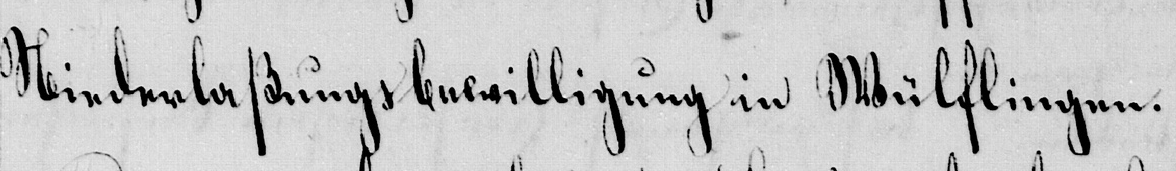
Niederlaßungsbewilligung in Wülflingen.
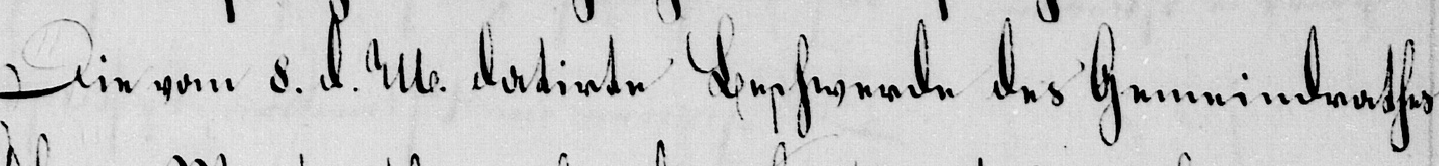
Die vom 8. d. M. datirte Beschwerde des Gemeindrathes
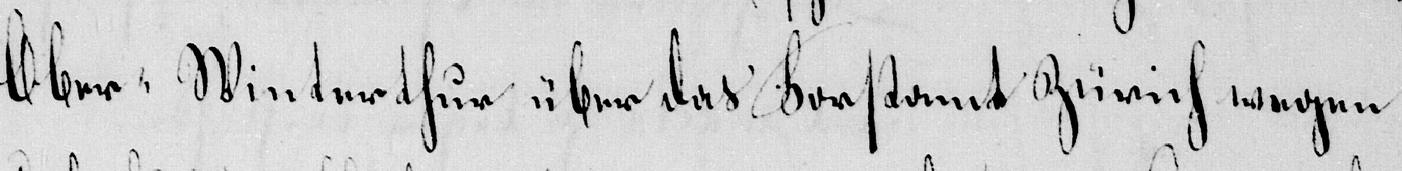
Ober-Winterthur über das Forstamt Zürich wegen
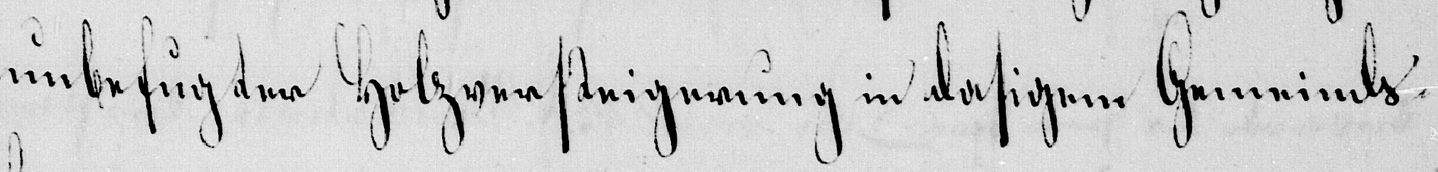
unbefugter Holzversteigerung in dortigem Gemeinds¬
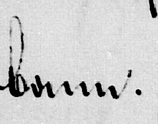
bann.
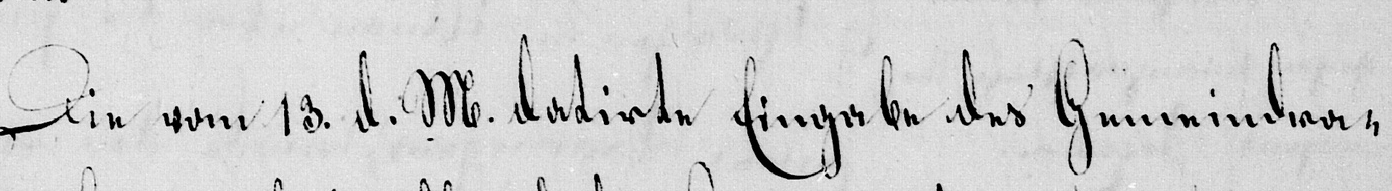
Die vom 13. d. M. datirte Eingabe des Gemeindra¬
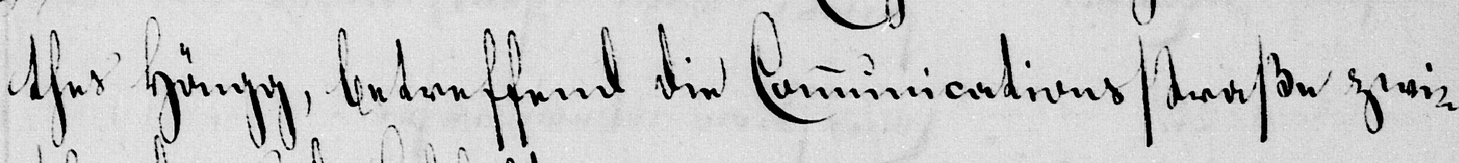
thes Höngg, betreffend die Communicationsstraße zwi¬
